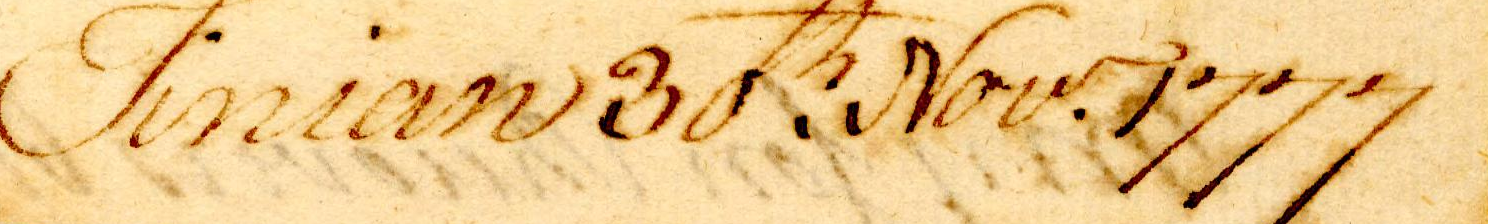Tinian 30^th Nov^r. 1777
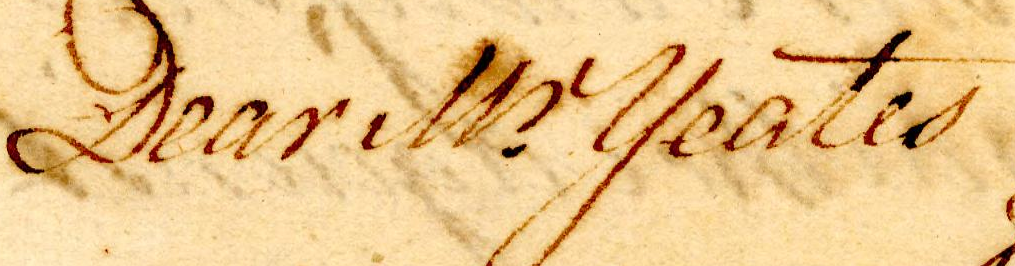Dear M^r. Yeates
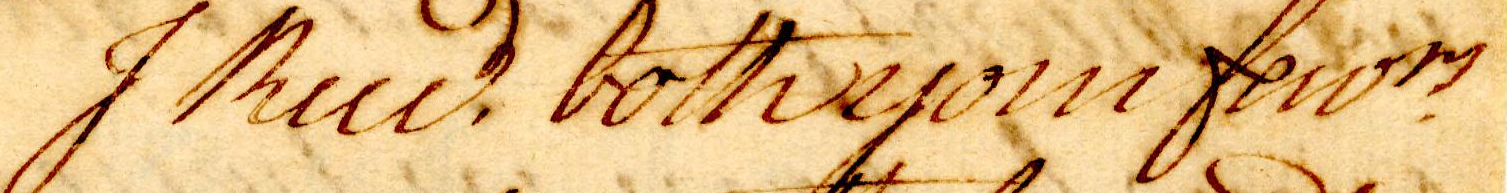I Rece^d. both your fav^rs
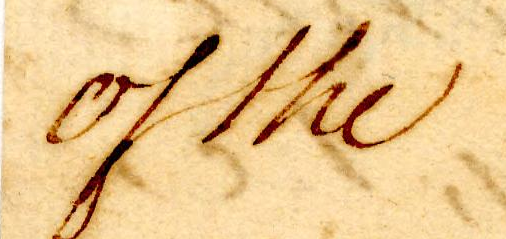of the
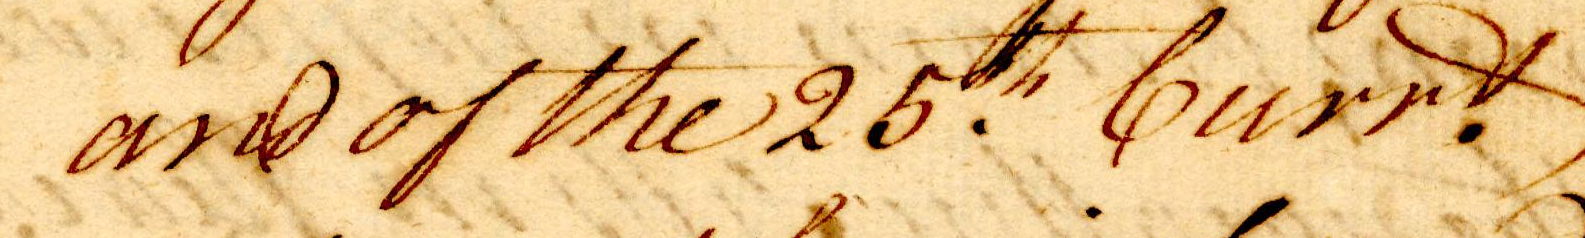and of the 25^th. Curr^t.
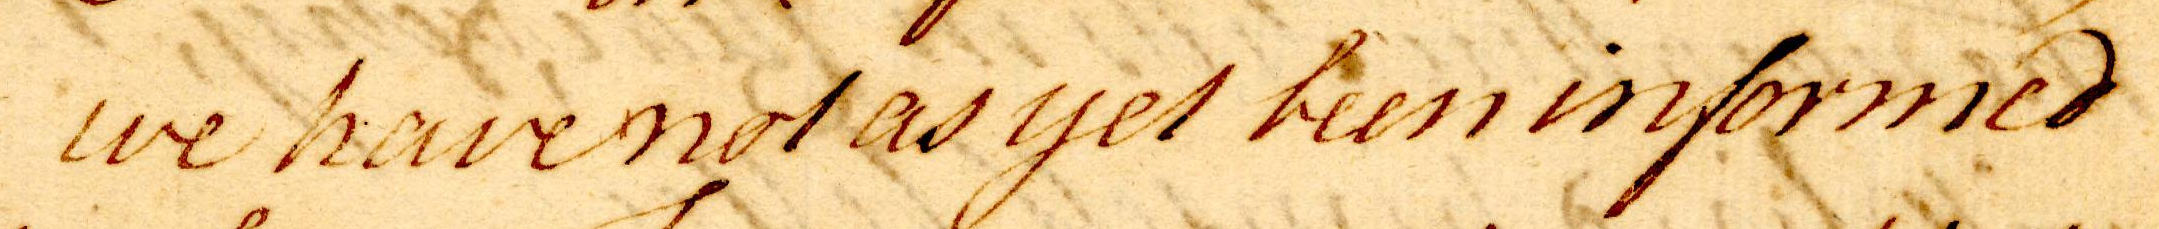we have not as yet been informed
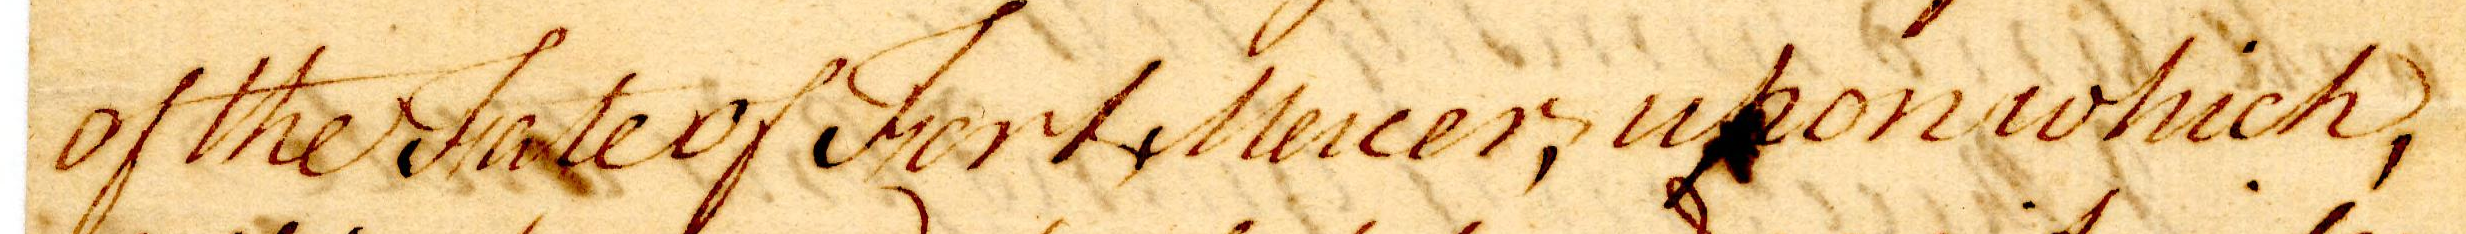of the State of Fort Mercer, upon which,
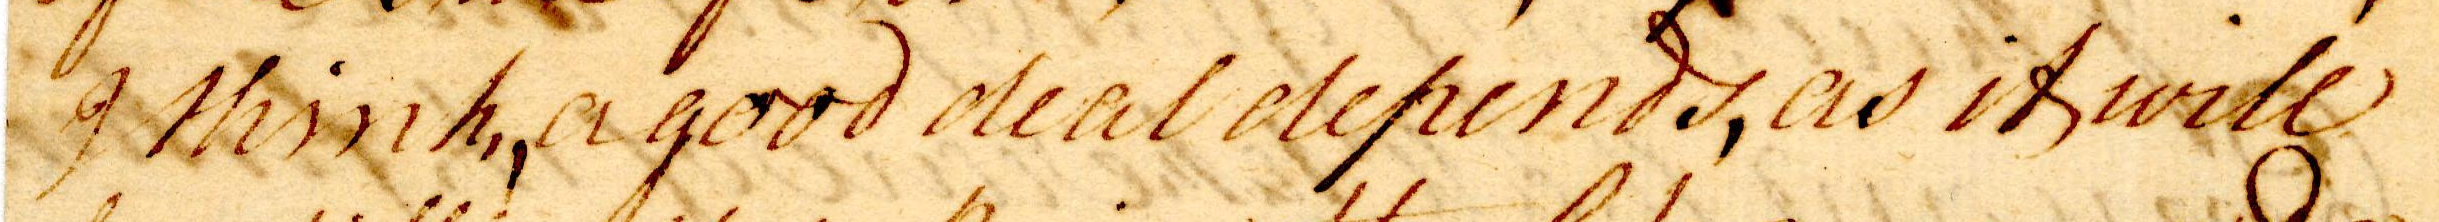I think, a good deal depends, as it will
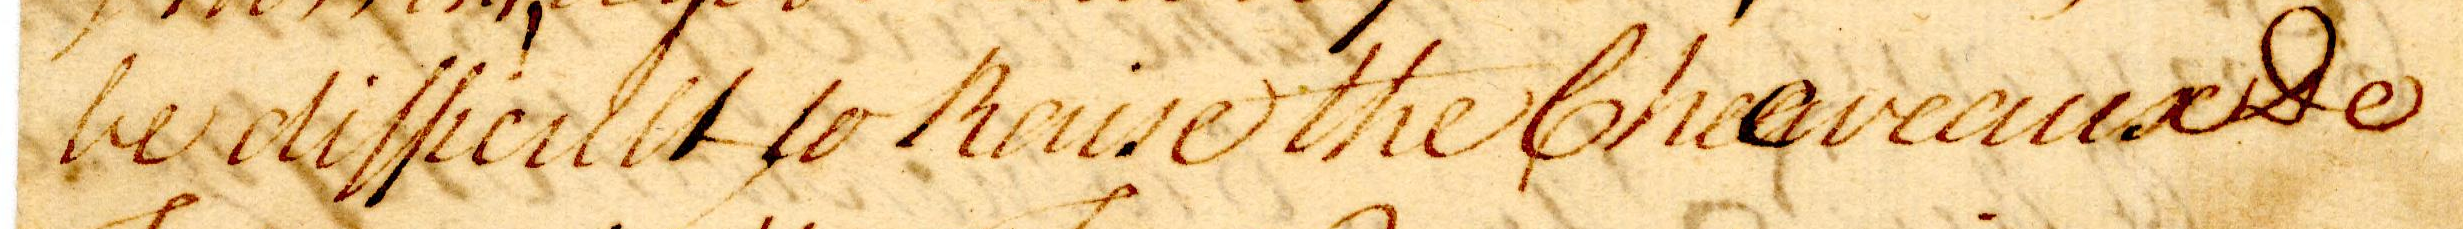be difficult to Raise the Cheaveauxe De
